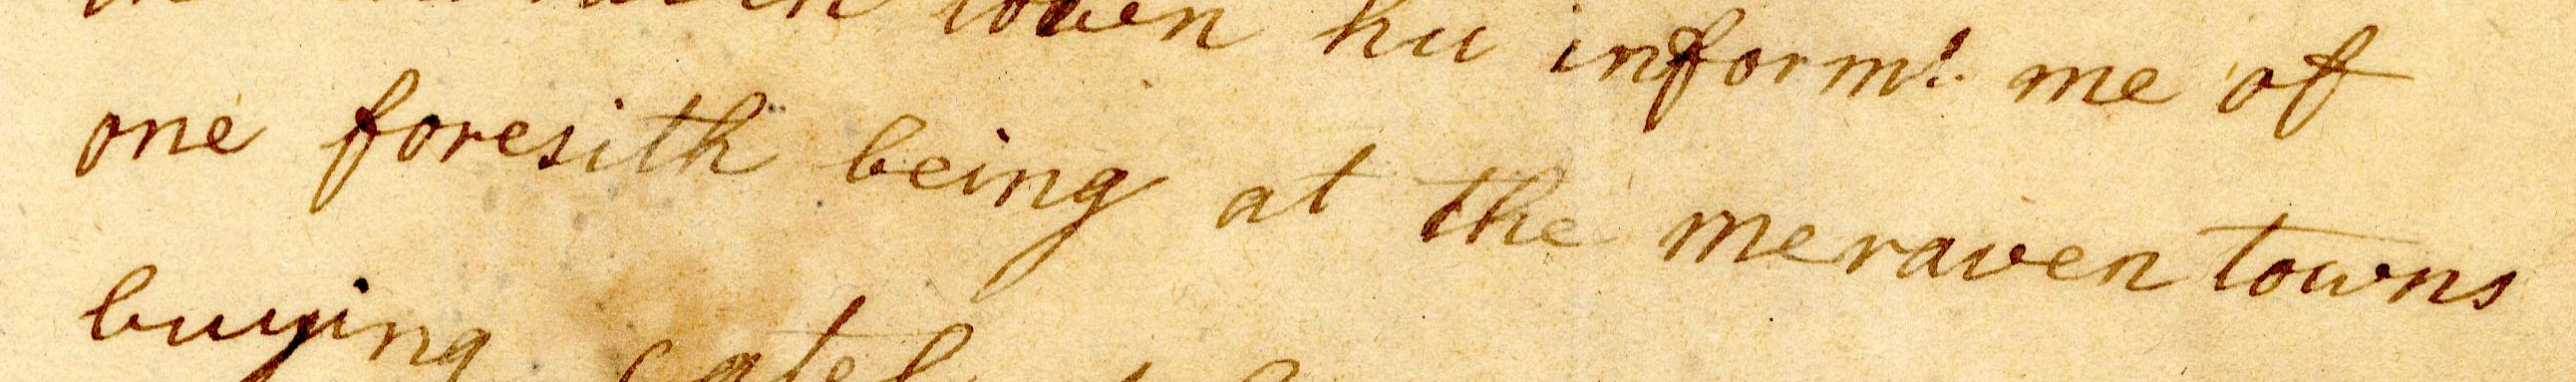one foresith being at the meraven towns
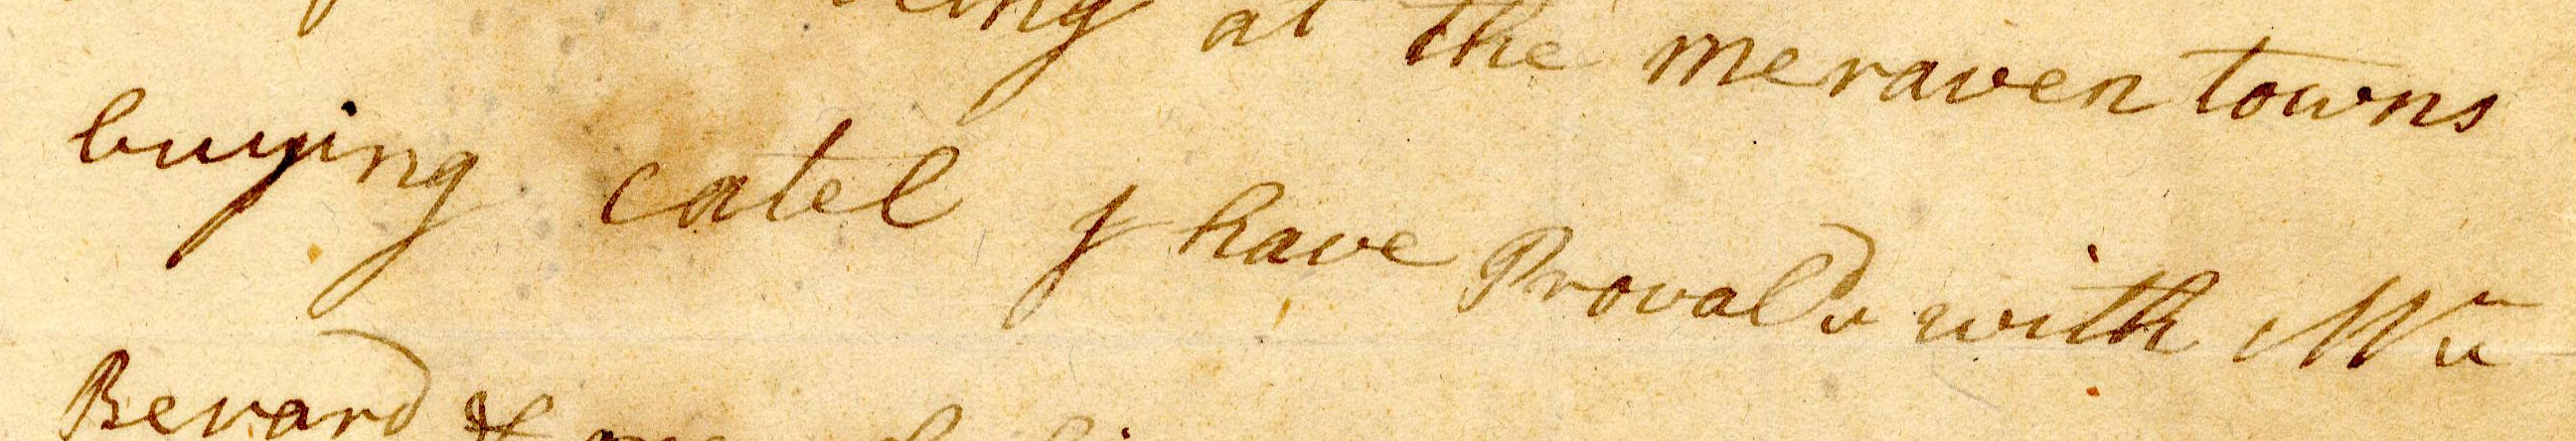buying catel I have Proval^d with M^r
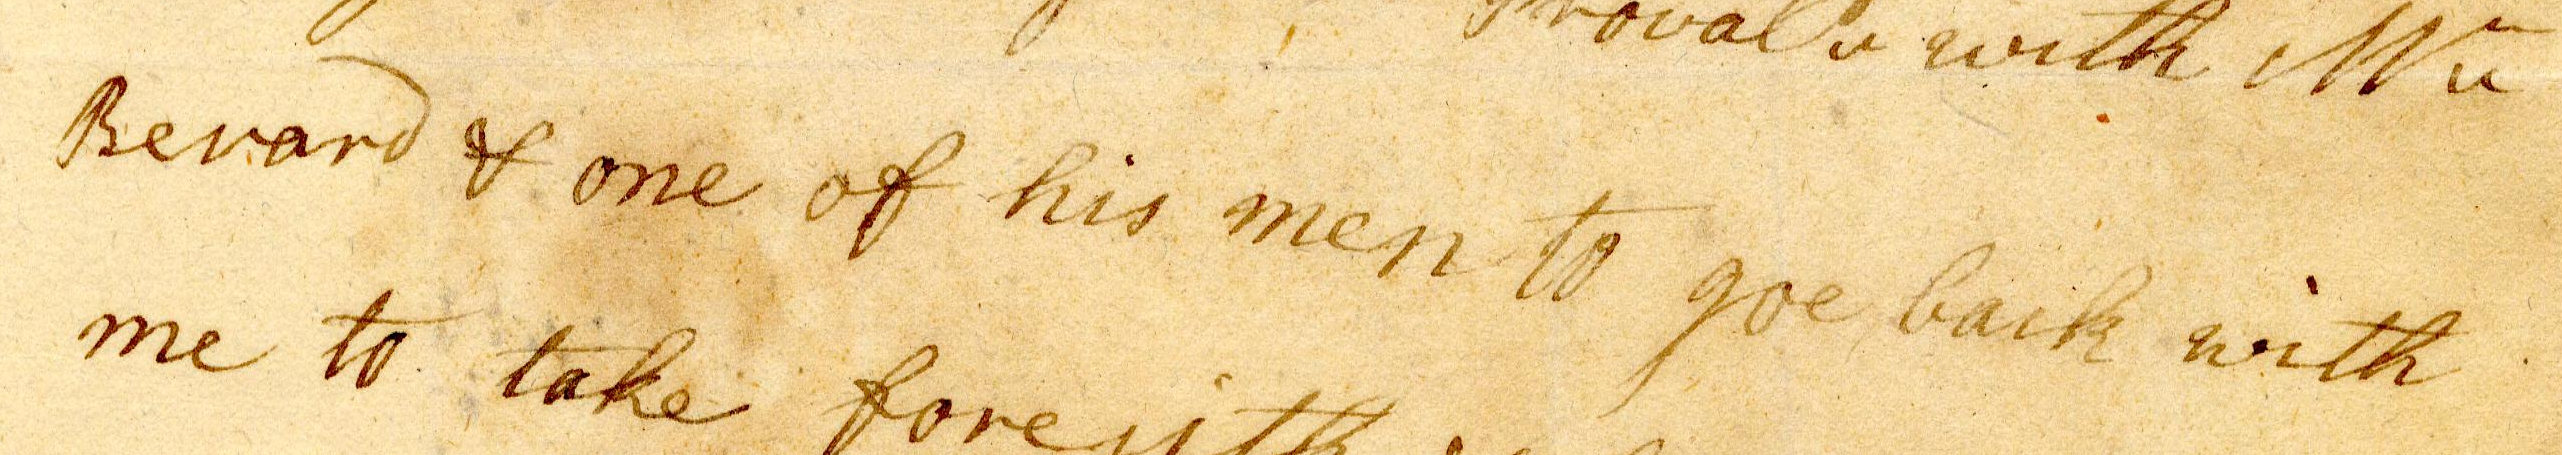Bevard & one of his men to goe back with
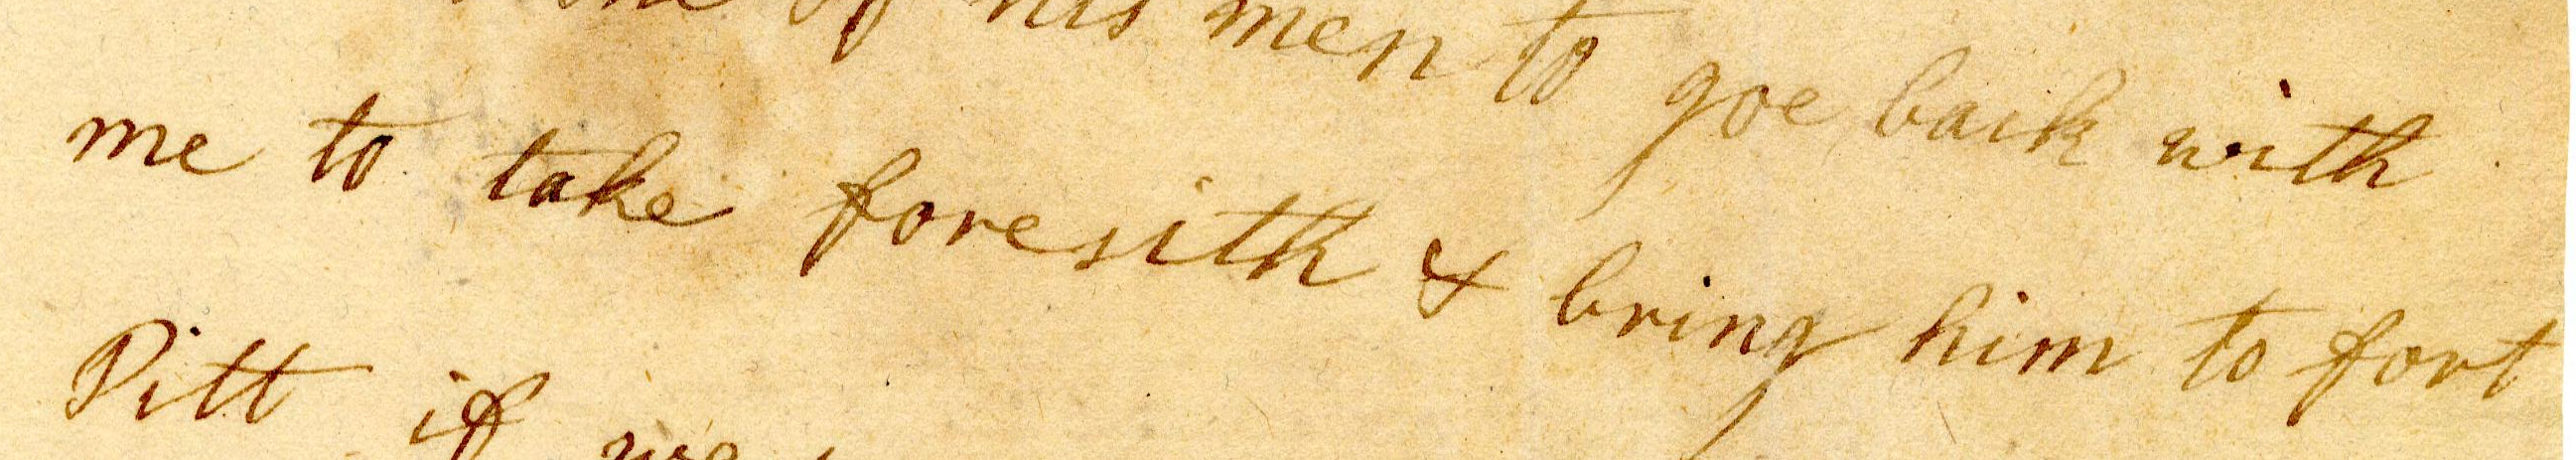me to take foresith & bring him to fort
